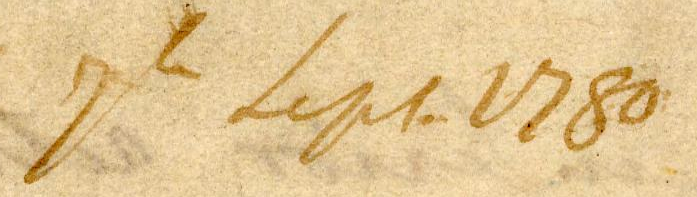7^th Sept. 1780
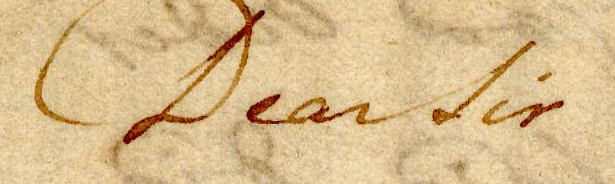Dear Sir
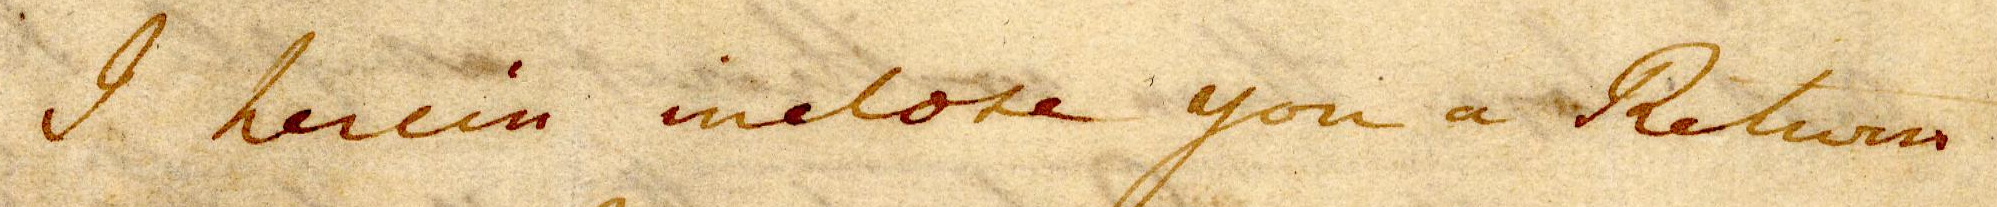I herein inclose you a Return
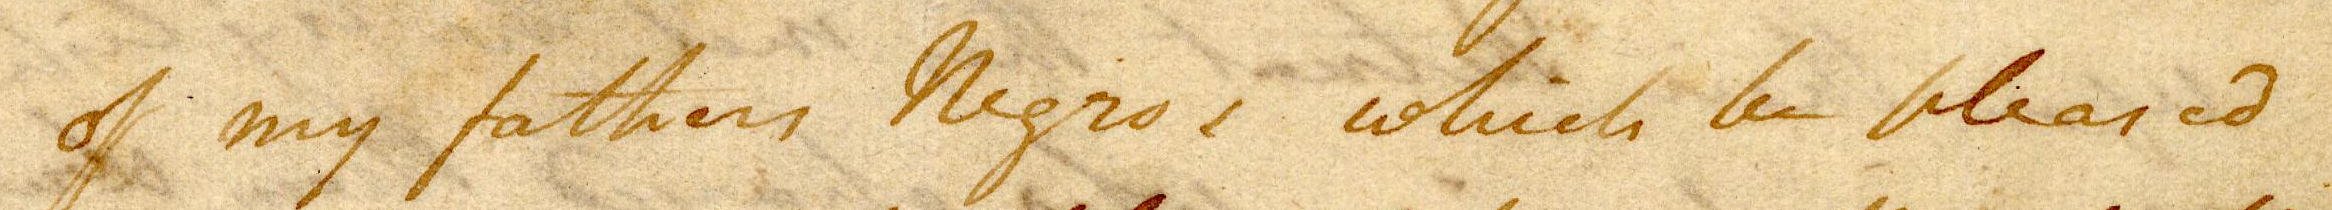of my fathers Negros which be bleased
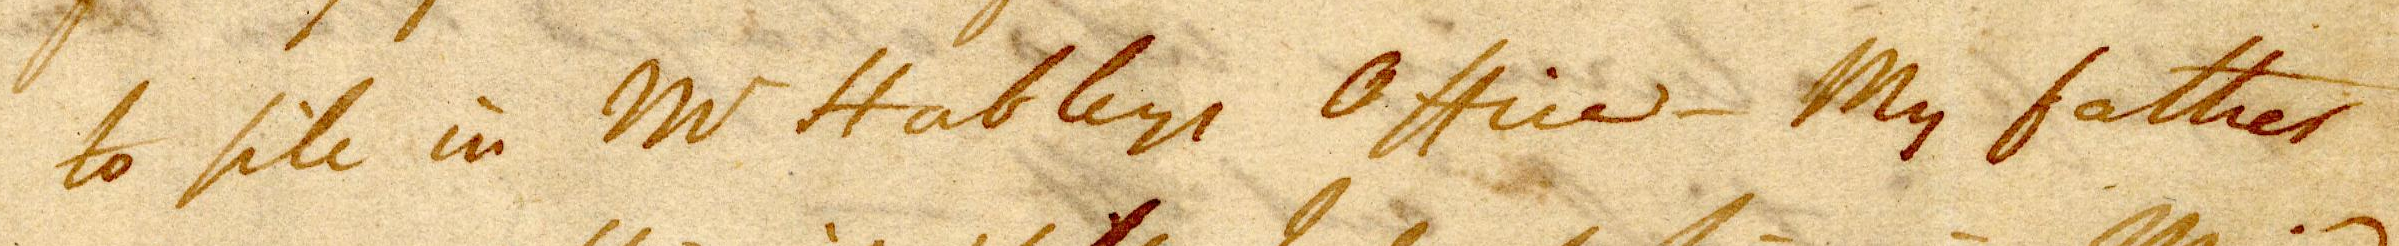to file in M^r Hablers Office. My father
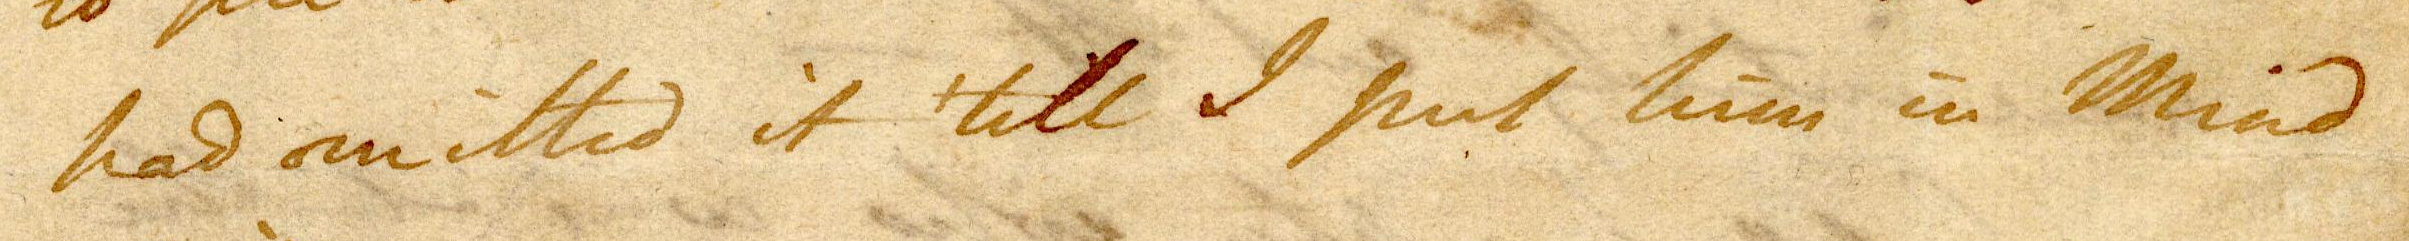had omitted it 'till I put him in Mind
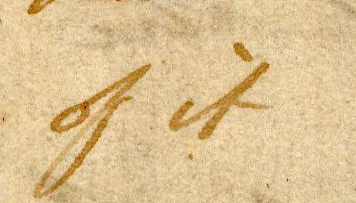of it
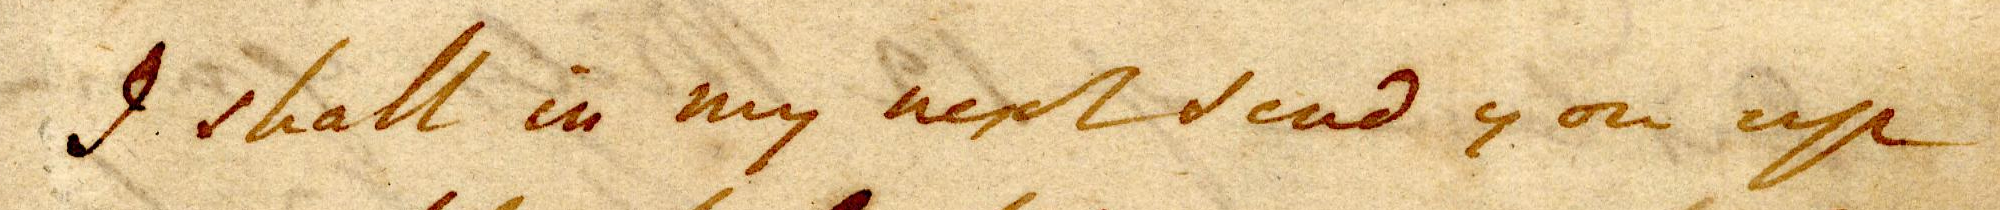I shall in my next send you up
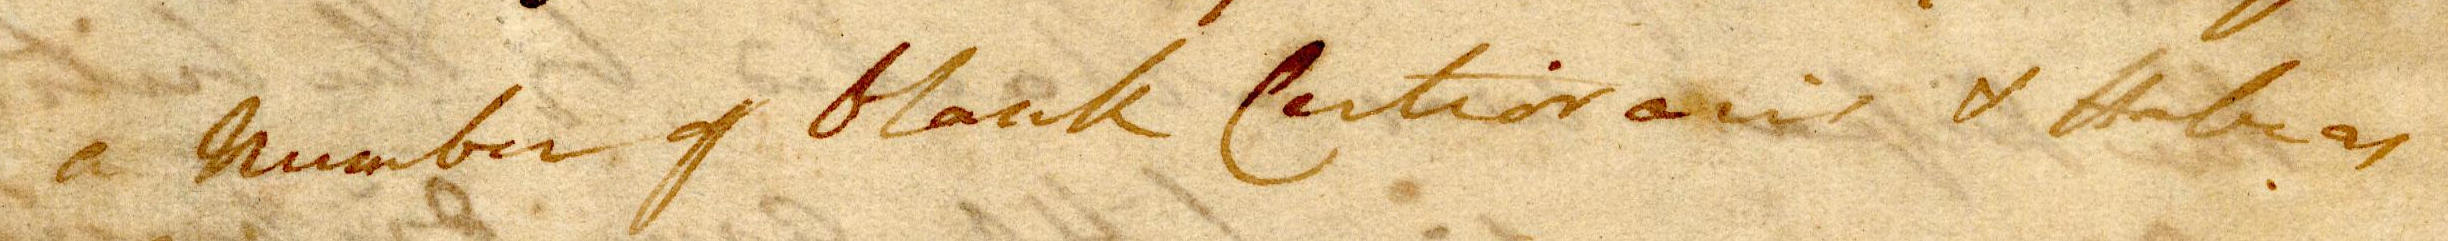a Number of black Certiorari & Habeas
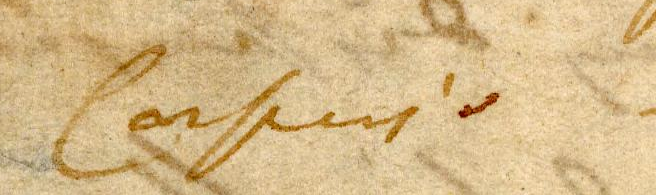Corpus's
